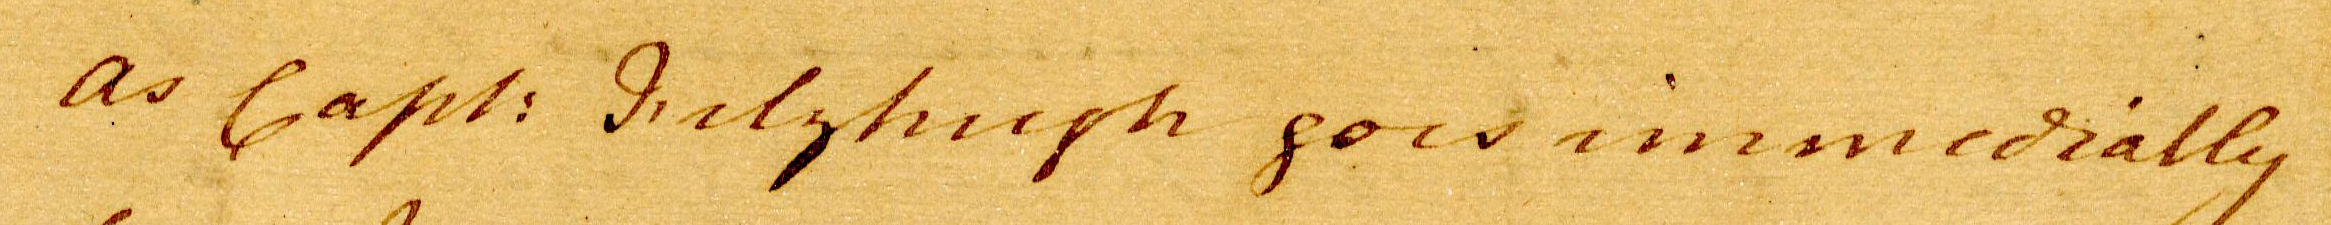As Capt: Fitzhugh goes immediatly
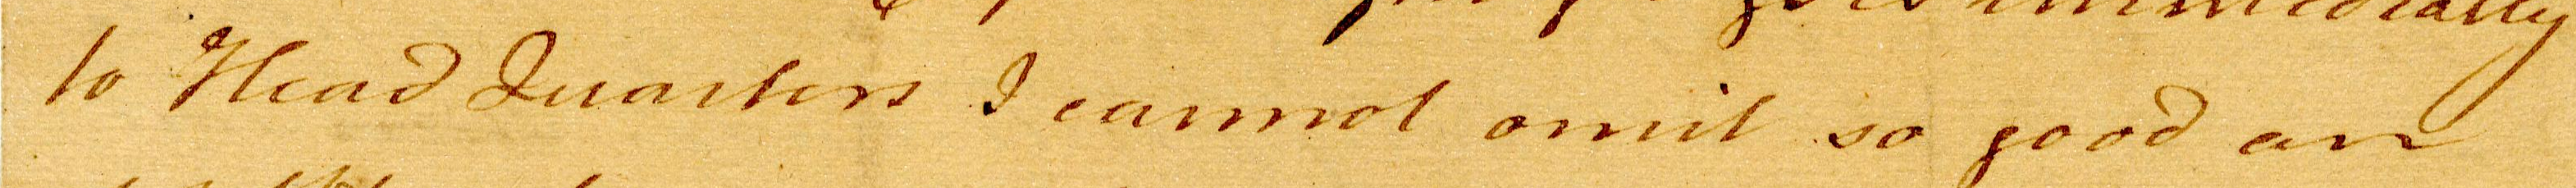to Head Quarters I cannot omit so good an
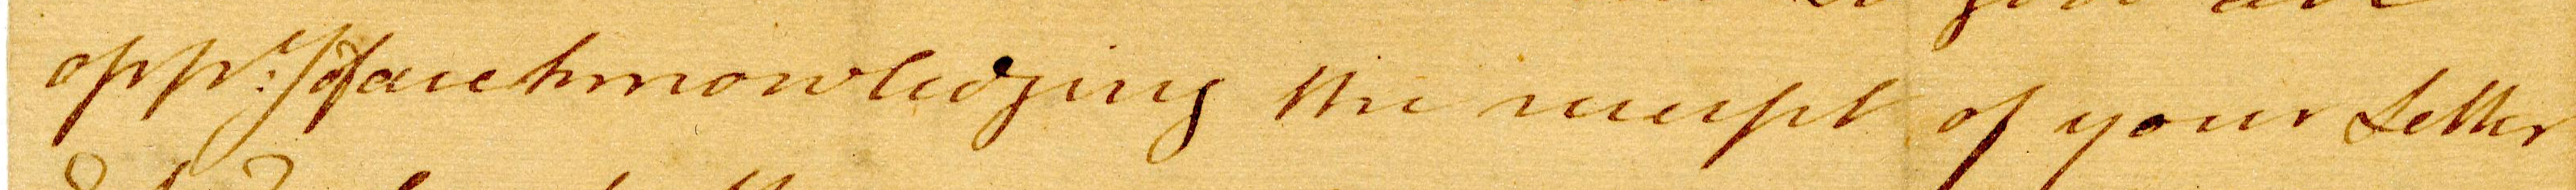opp^y: of acknowledging the receipt of your Letter
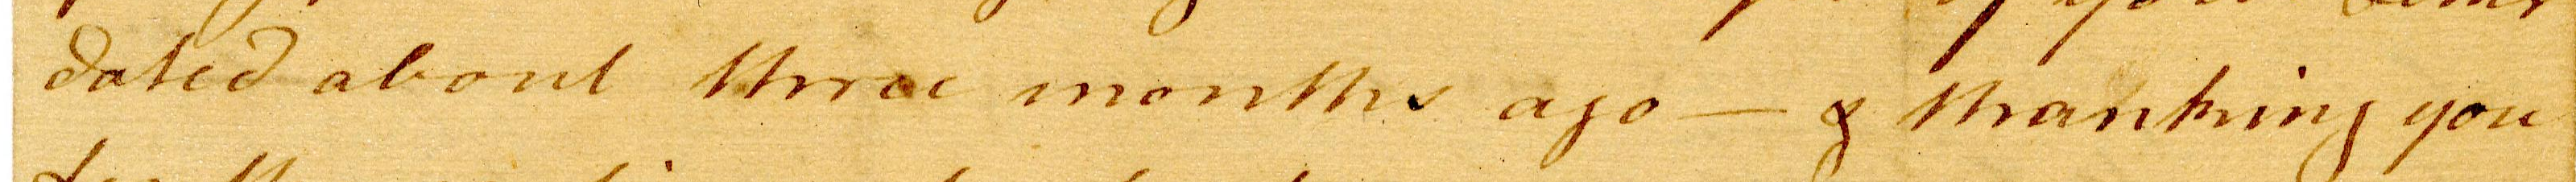dated about three months ago- & thanking you
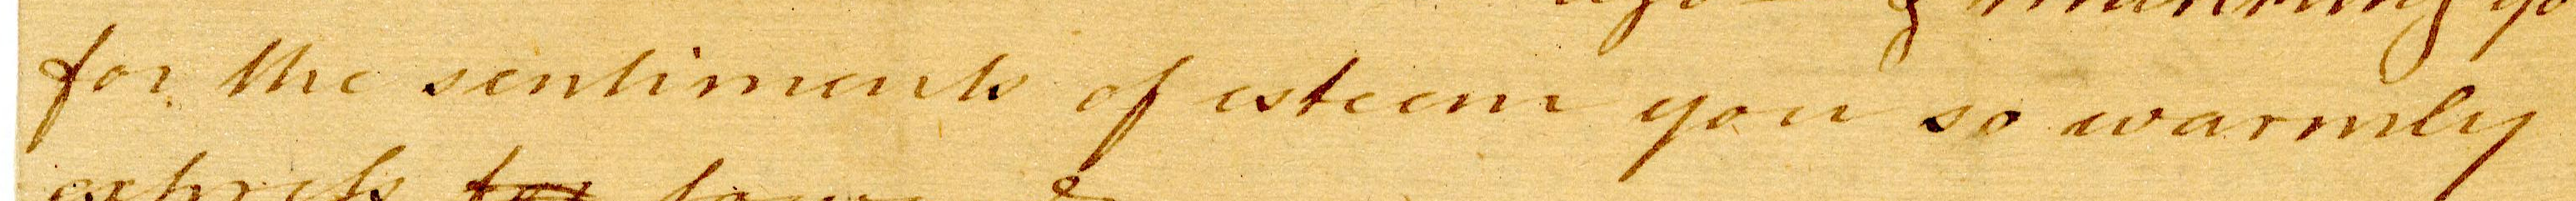for the sentiments of esteem you so warmly
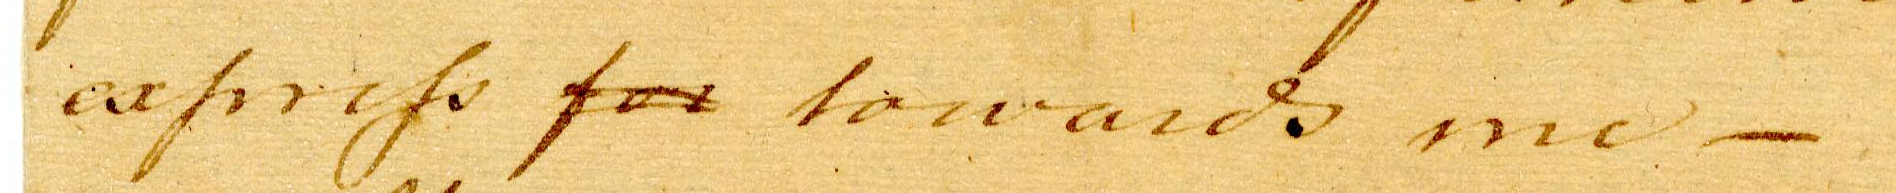express [for] towards me-
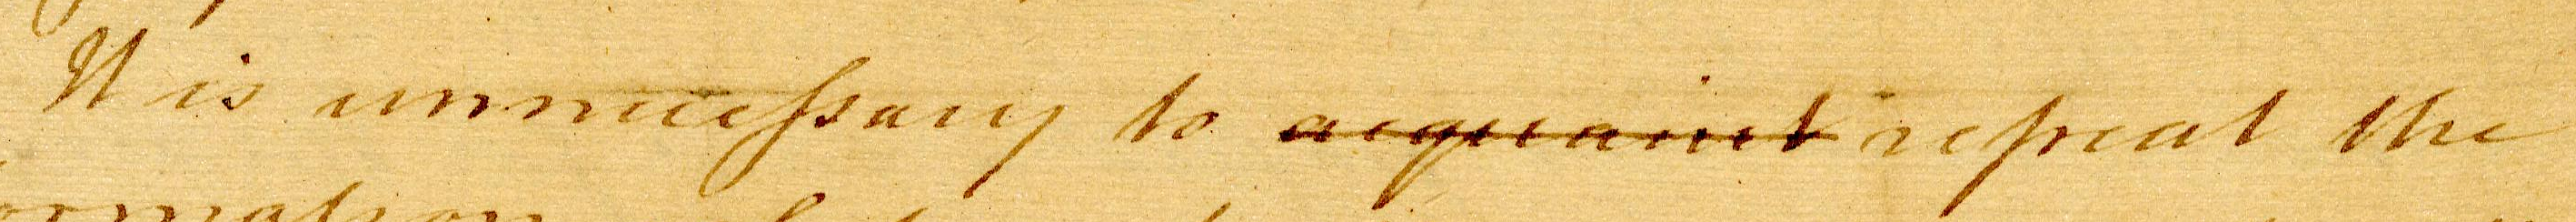It is unnecessary to [acquaint] repeat the
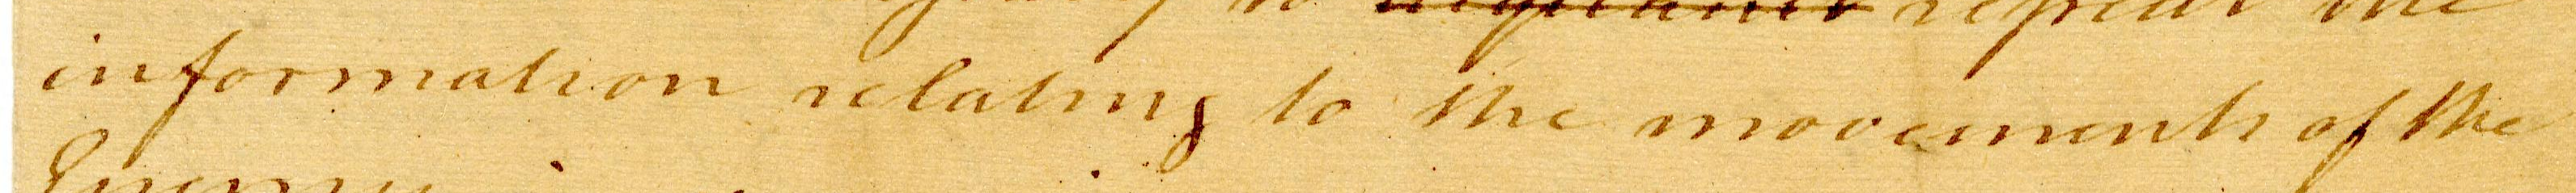information relating to the movements of the
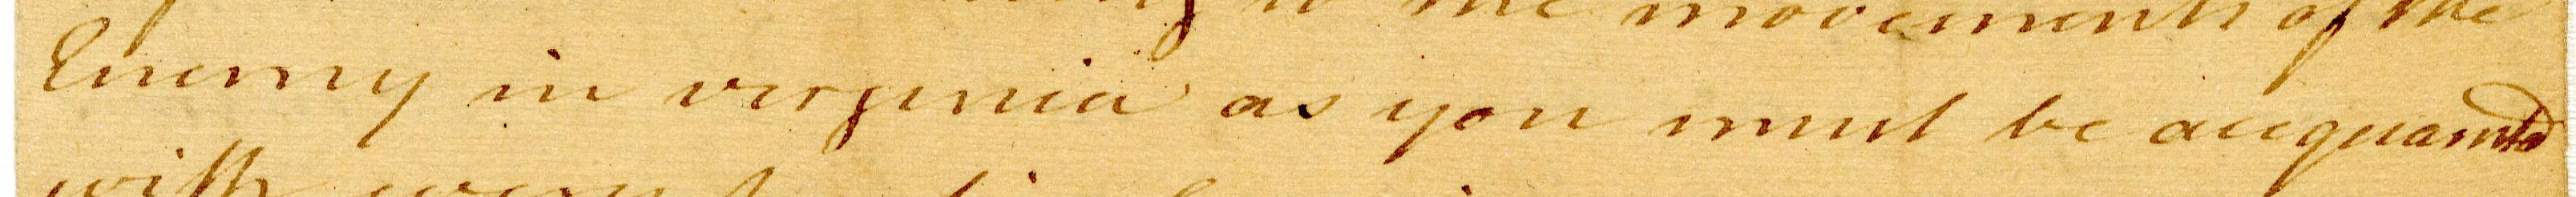Enemy in virginia as you must be accquainted
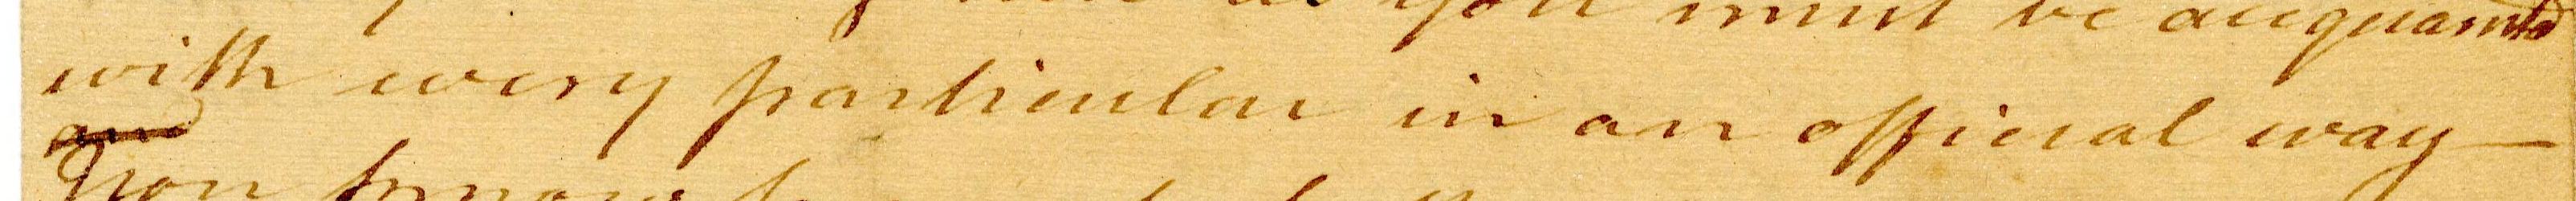with every particular in an official way-
